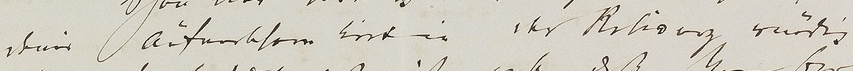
deiner Aufmerksamkeit in der Residenz würdig
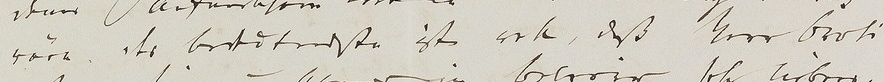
wäre. Das bedeutendste ist wohl, daß Herr Brosi
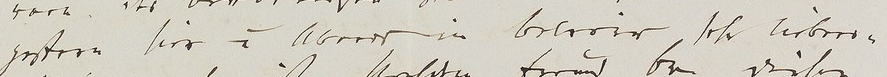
gestern hier u Abends im Belvoir sehr liebens-
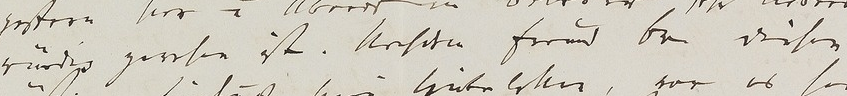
würdig gewesen ist. Nachdem Freund Br diesen
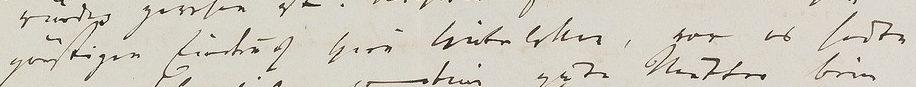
günstigen Eindruck hier hinterlassen, war es heute
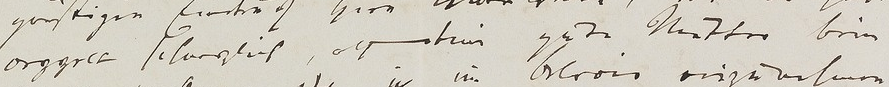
doppelt schmerzlich, als deine gute Mutter beim
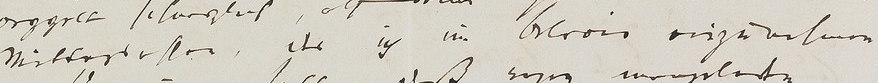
Mittagsessen, das ich im Belvoir einzunehmen
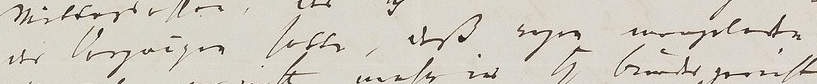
das Vergnügen hatte, daß wegen mangelnden
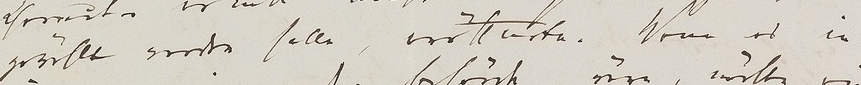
gewählt werden solle, eröffnete. Wenn es in
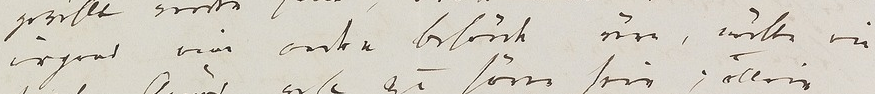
irgend eine andre Behörde wäre, möchte ein
